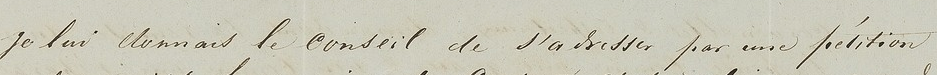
Je lui donnais le conseil de s'adresser par une pétition
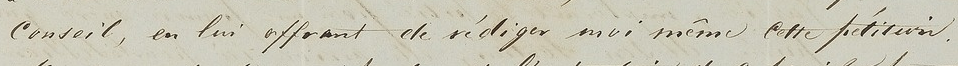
conseil, en lui offrant de rédiger moi même cette pétition.
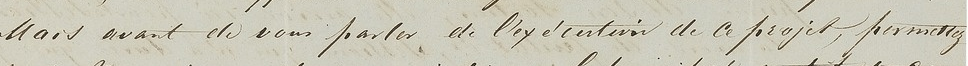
Mais avant de vous parler de l'exécution de ce projet, permettez
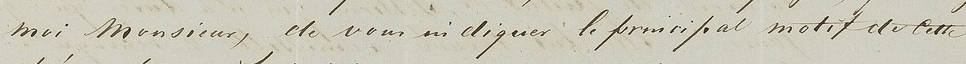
moi Monsieur, de vous indiquer le principal motif de cette
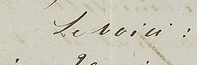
Là voici:
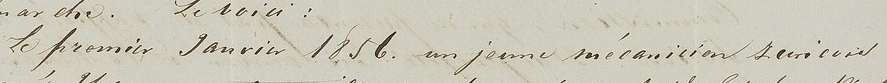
Le premier Janvier 1856 un jeune mécanicien zuricois
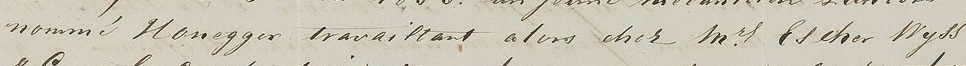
nommé Honegger travaillait alors chez Mrs Escher Wyss
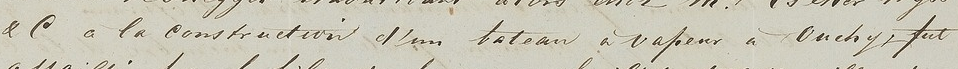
& Co. à la construction d'un bateau à vapeur à Ouchy, fut
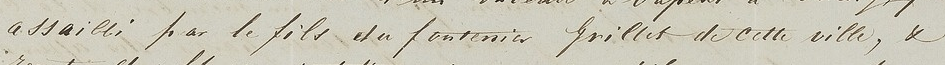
assailli par le fils du fontenier Grillet de cette ville, &
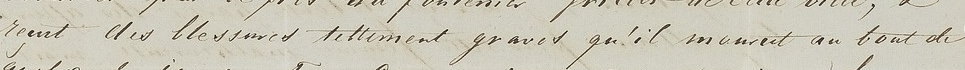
reçut des blessures tellement graves qu'il mourut au bout de
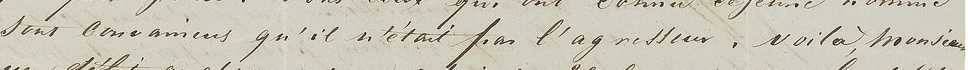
sont convaincus qu'il n'était pas l'agresseur. Voilà Monsieur,
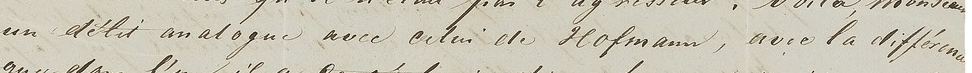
un délit analogue avec celui de Hofmann, avec la différence
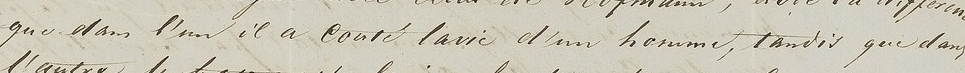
que dans l'un il a coûté la vie d'un homme, tandis que dans
